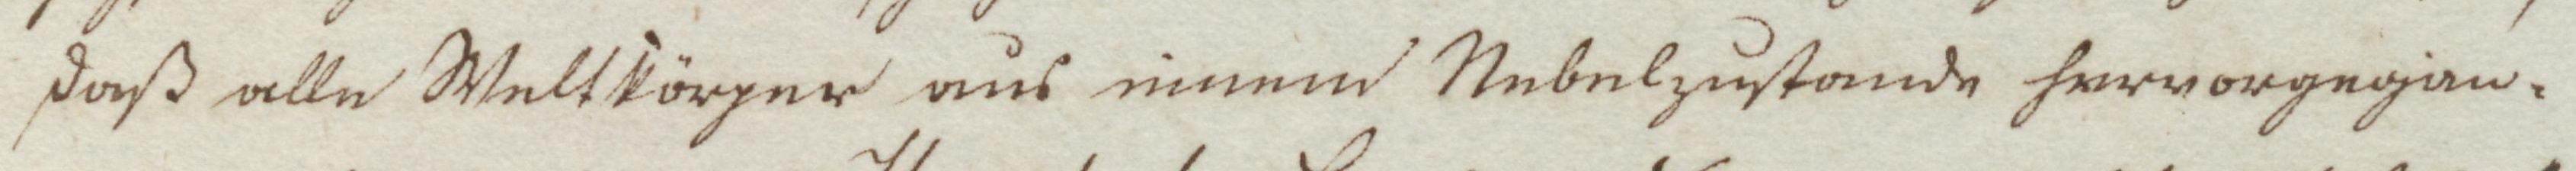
daß alle Weltkörper aus einem Nebelzustande hervorgegan-
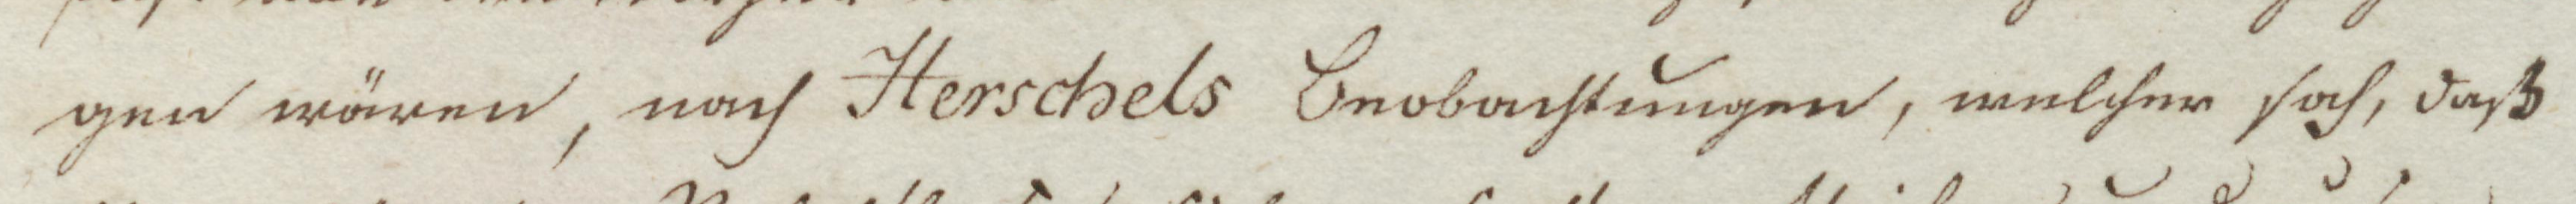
gen wären, nach Herschels Beobachtungen, welcher sah, daß
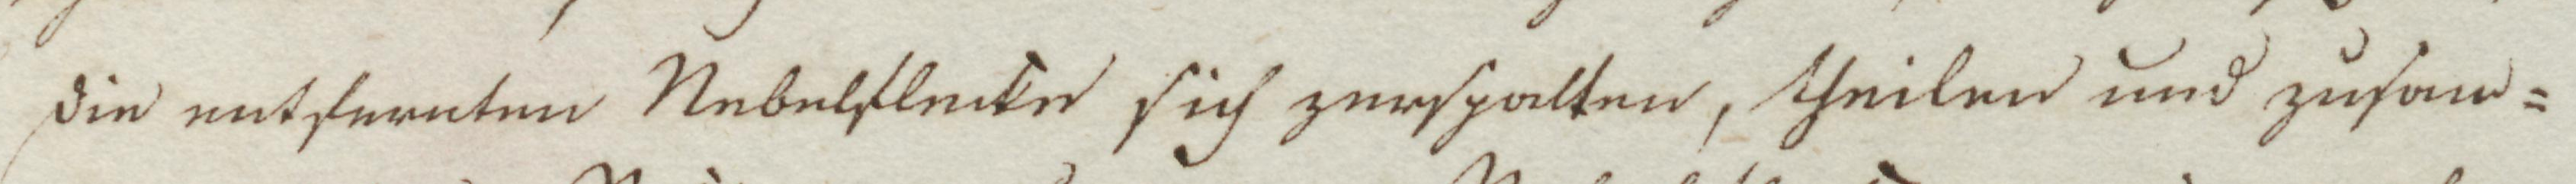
die entfernten Nebelflecke sich zerspalten, theilen und zusam-
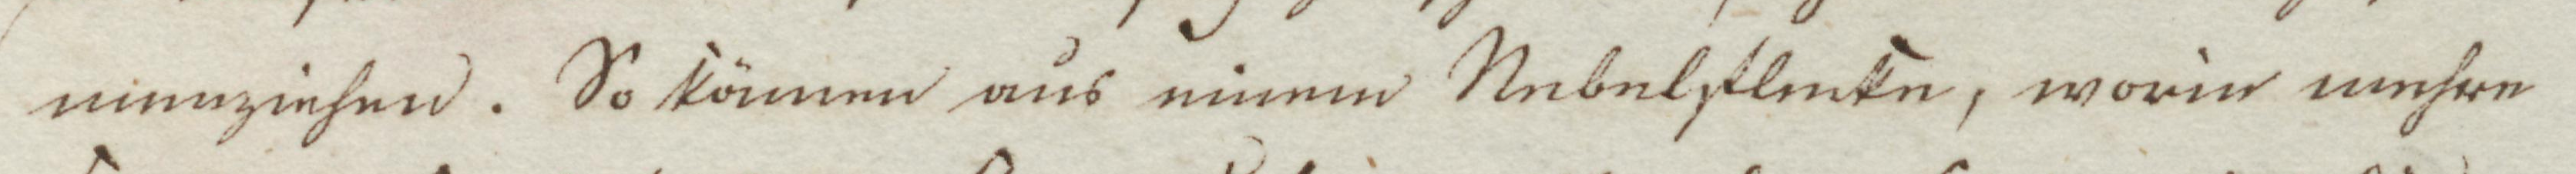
menziehen. So können aus einem Nebelflecke, worin mehre
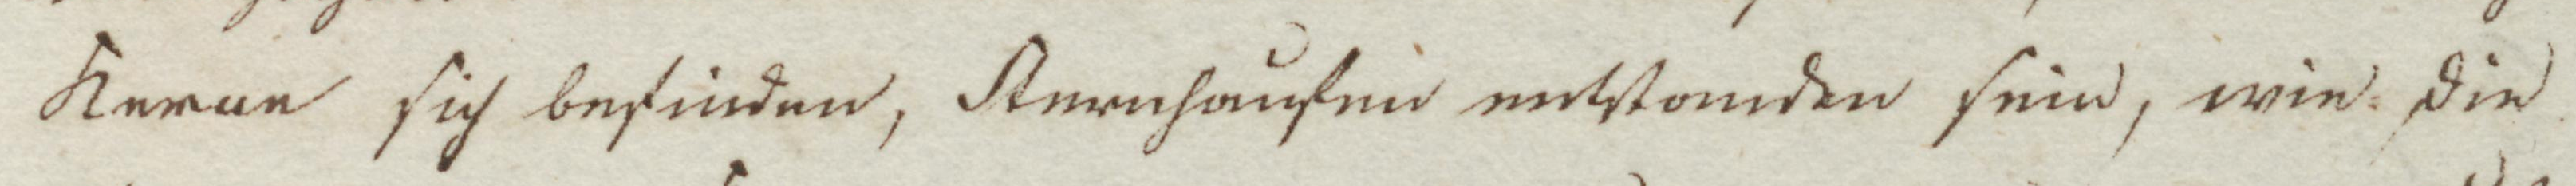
Kerne sich befinden, Sternhaufen entstanden sein, wie die
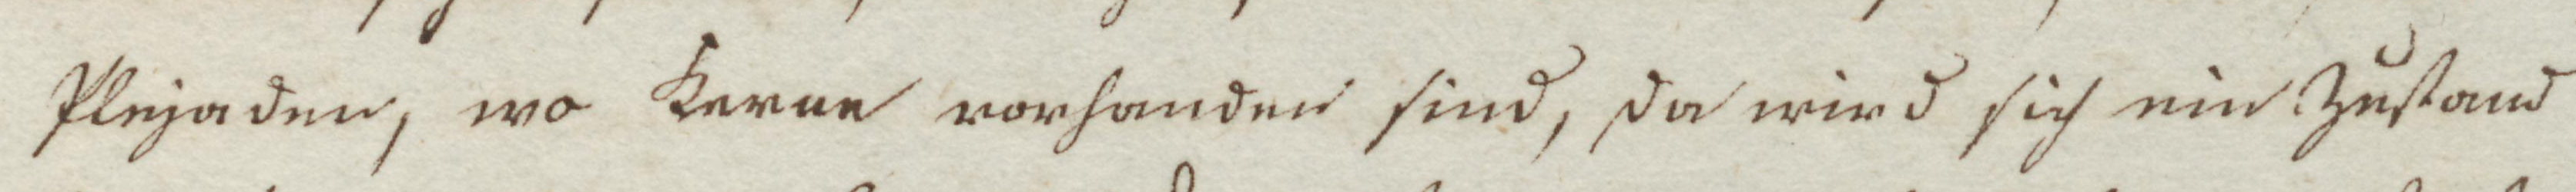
Plejaden, wo Kerne vorhanden sind, da wird sich ein Zustand
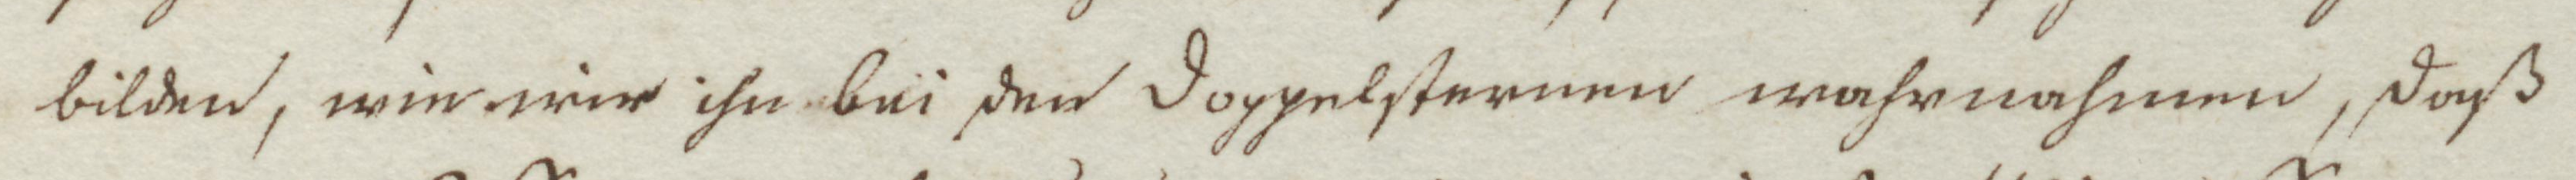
bilden, wie wir ihn bei den Doppelsternen wahrnahmen, daß
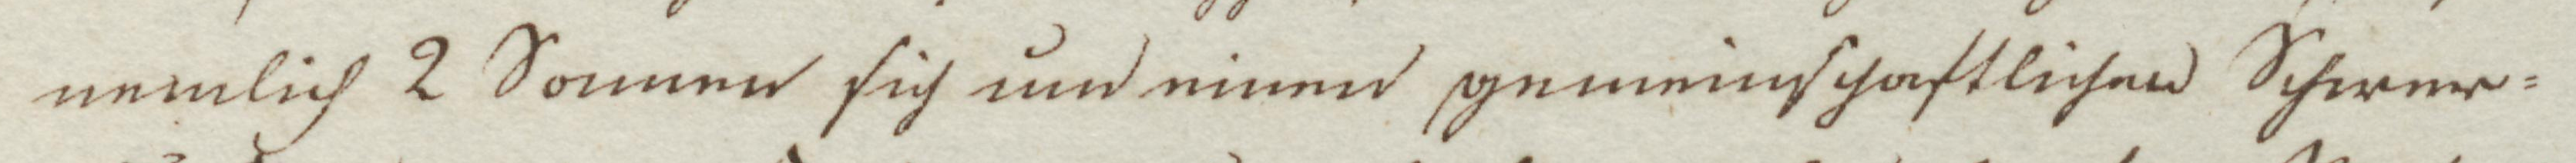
nemlich 2 Sonnen sich um einen gemeinschaftlichen Schwer-
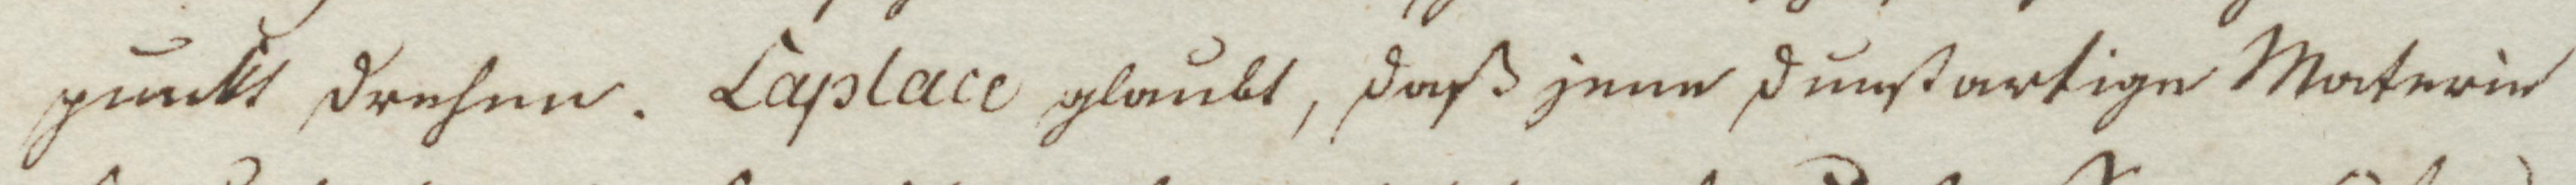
punkt drehen. Laplace glaubt, daß jene dunstartige Materie
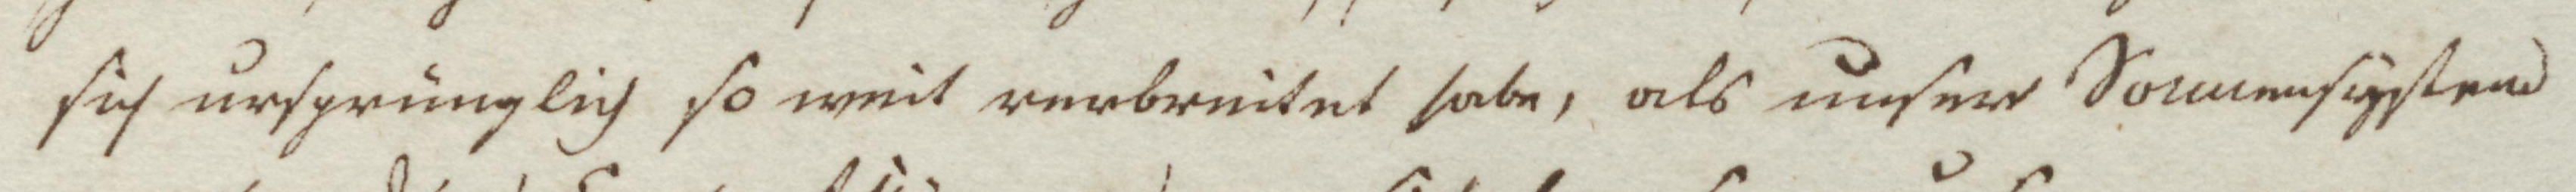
sich ursprünglich so weit verbreitet habe, als unser Sonnensÿstem
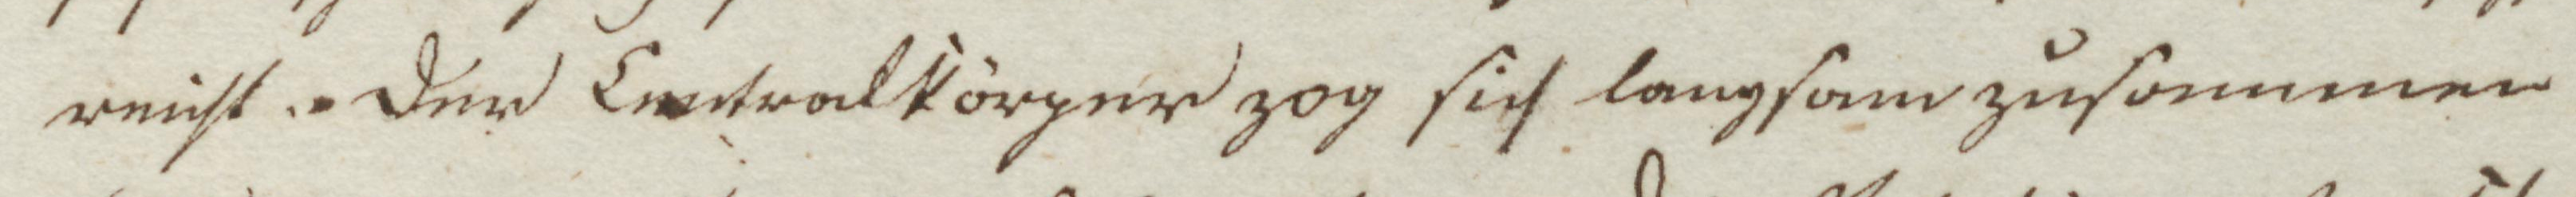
reicht. Der Centralkörper zog sich langsam zusammen
